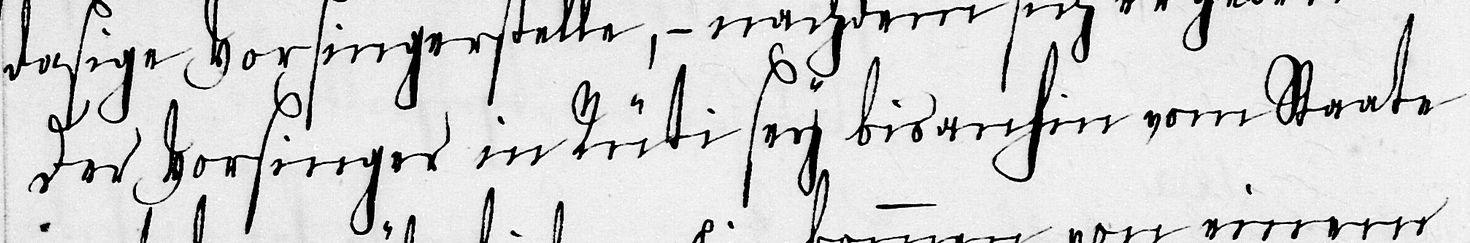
Der Vorsinger in Rüti sey bis anhin vom Staate
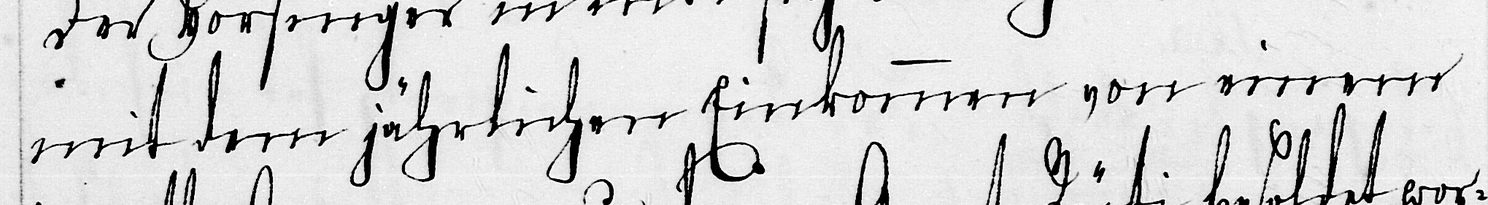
mit dem jährlichen Einkommen von einem
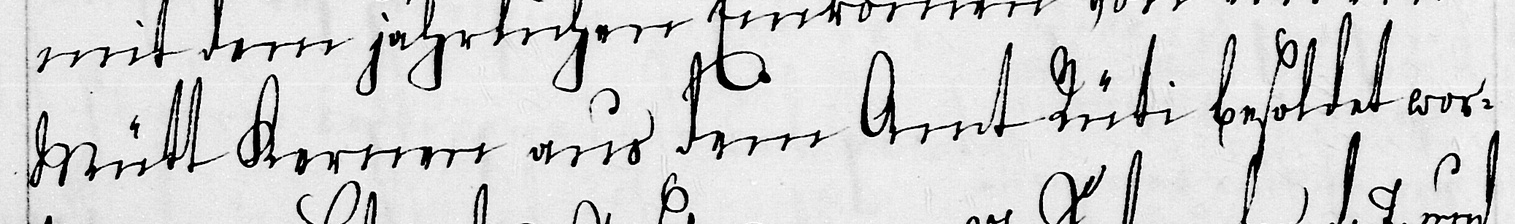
Mütt Kernen aus dem Amt Rüti besoldet wo¬
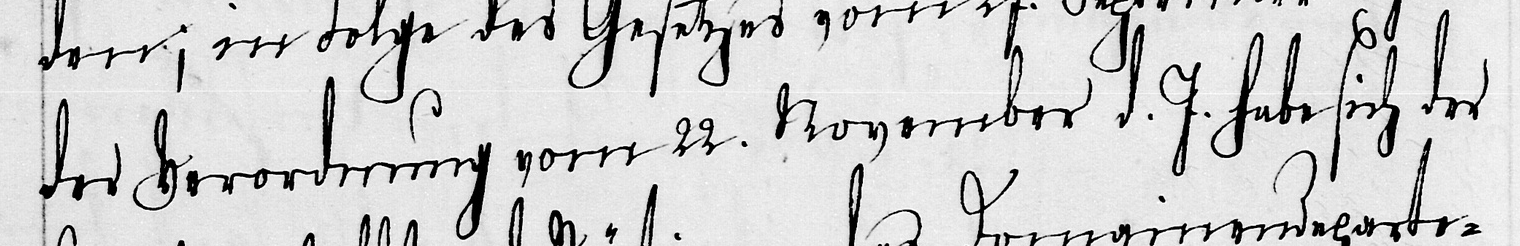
der Verordnung vom 22. November d. J. habe sich der
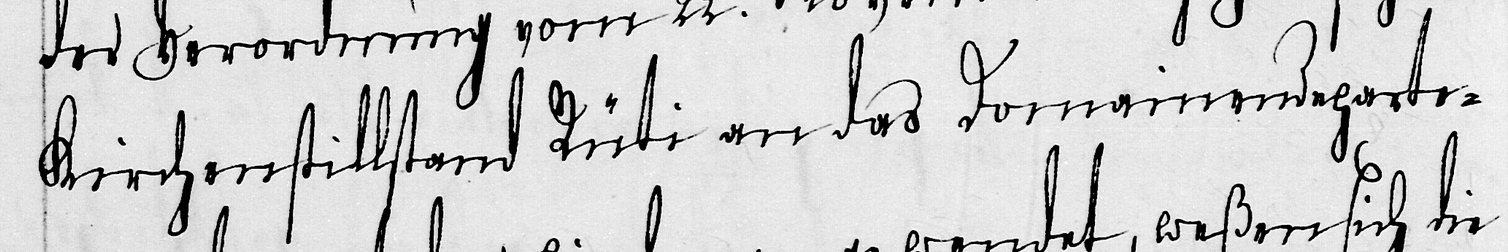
Kirchenstillstand Rüti an das Domainendeparte¬
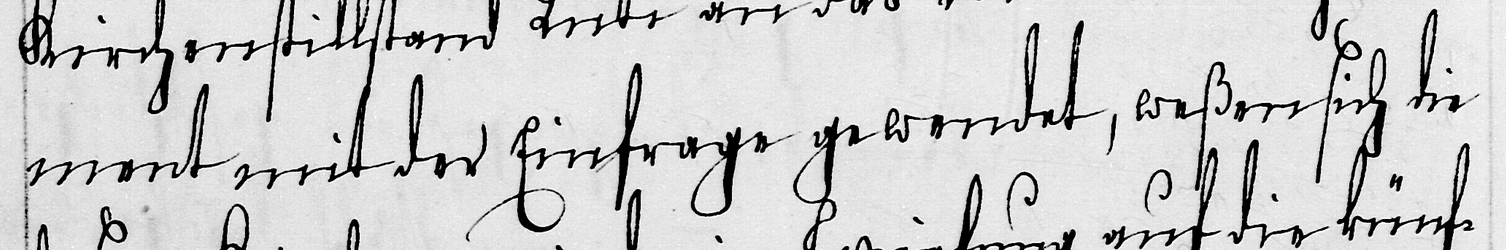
ment mit der Einfrage gewendet, weßen sich die
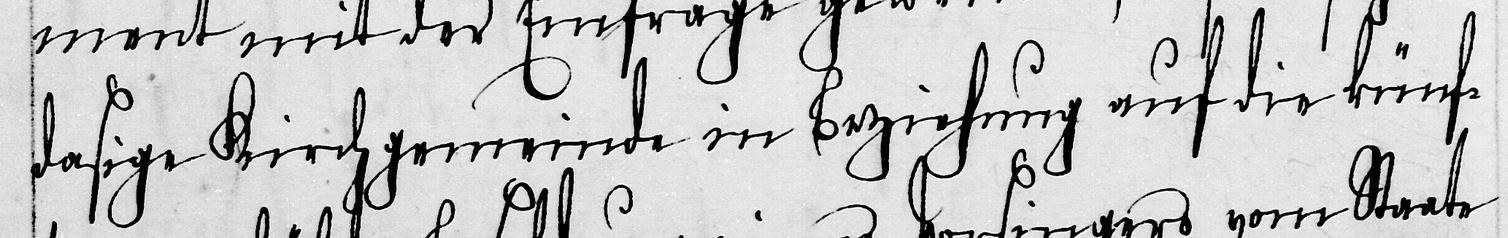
dasige Kirchgemeinde in Beziehung auf die künf¬
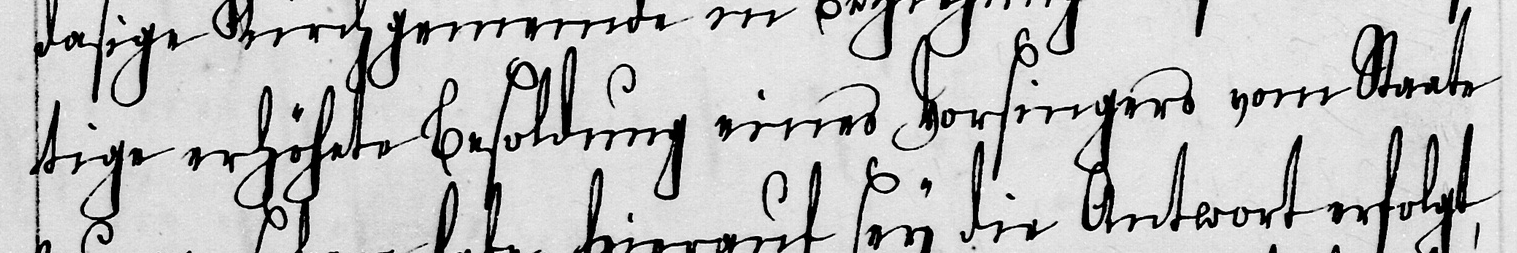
tige erhöhete Besoldung eines Vorsingers vom Staate
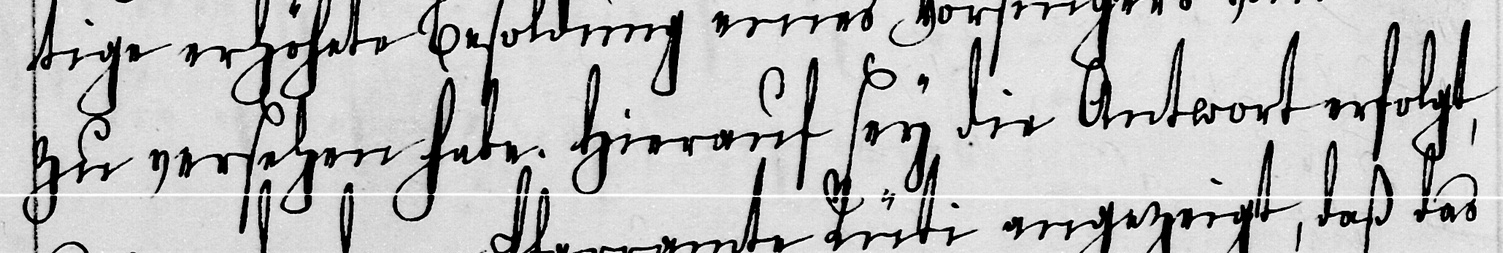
zu versehen habe. Hierauf sey die Antwort erfolg¬
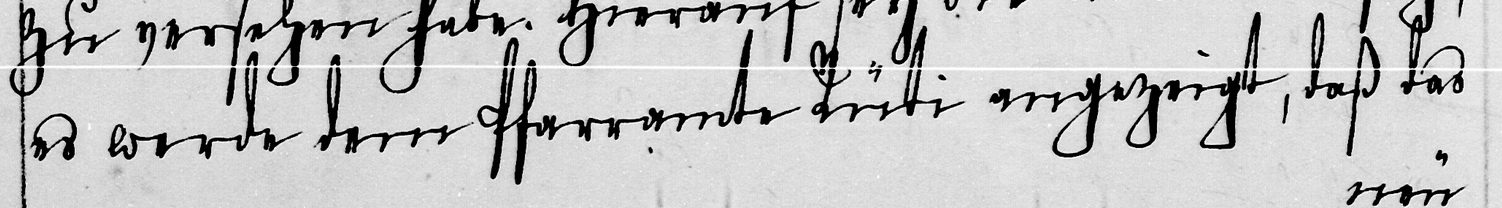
es werde dem Pfarramte Rüti angezeigt, daß das
